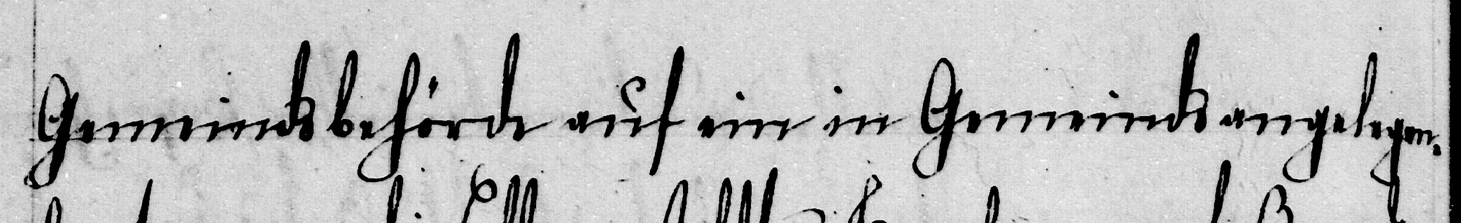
Gemeindsbehörde auf ein in Gemeindsangelegen¬
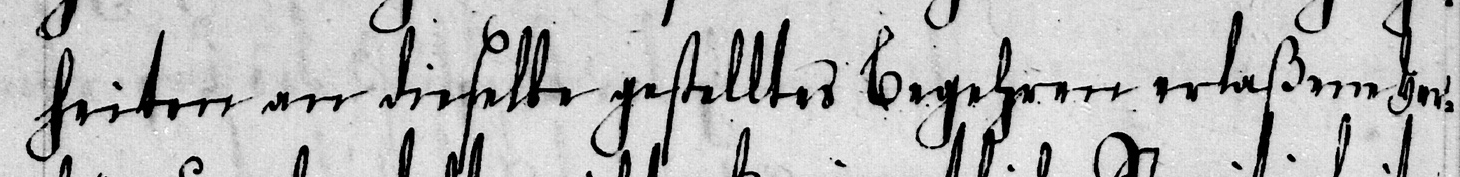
heiten an dieselbe gestelltes Begehren erlaßene Ve¬
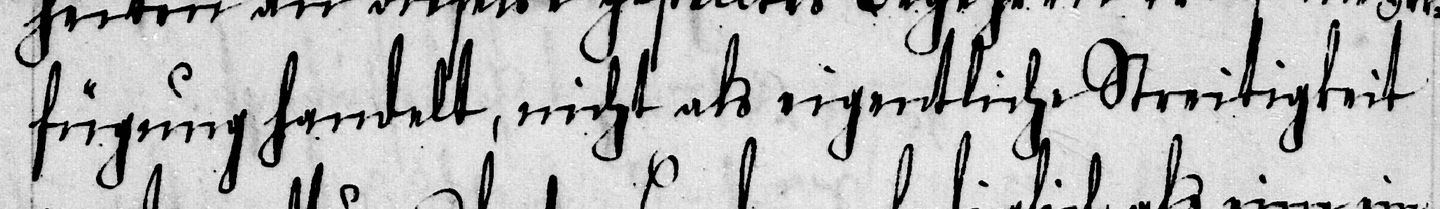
rfügung handelt, nicht als eigentliche Streitigkeit
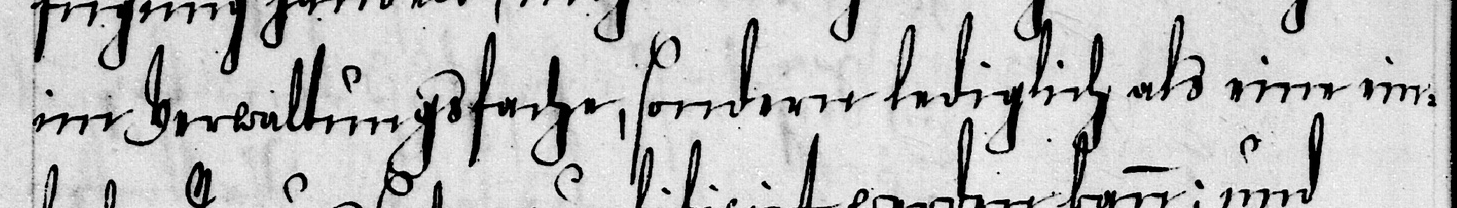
im Verwaltungsfache, sondern lediglich als eine ein¬
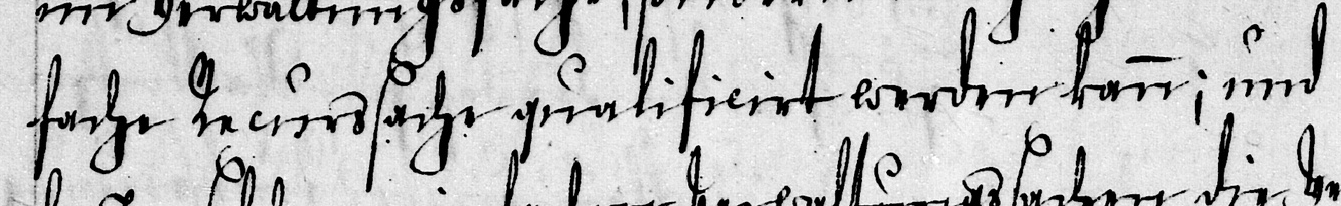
fache Recurssache qualificirt werden kann; und
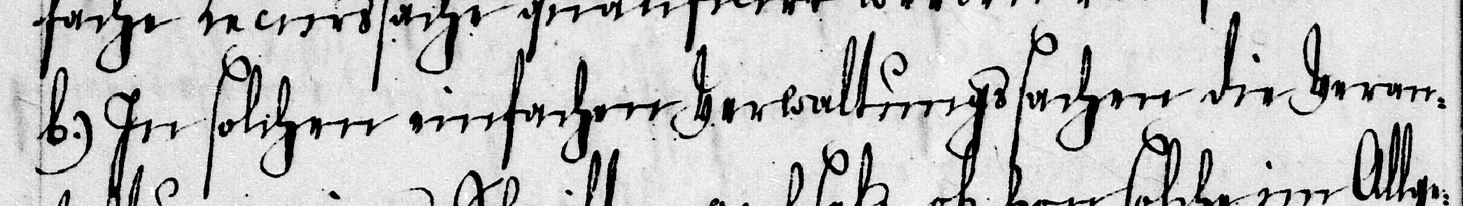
b.) In solchen einfachen Verwaltungssachen die Veran¬
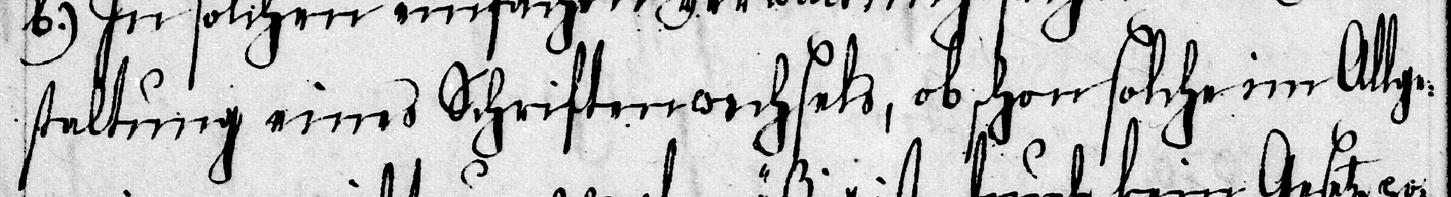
staltung eines Schriftenwechsels, obschon solche im Allge¬
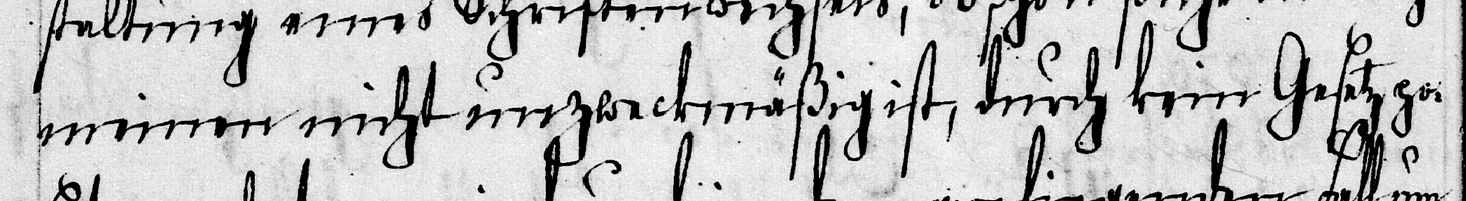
meinen nicht unzweckmäßig ist, durch kein Gesetz po¬
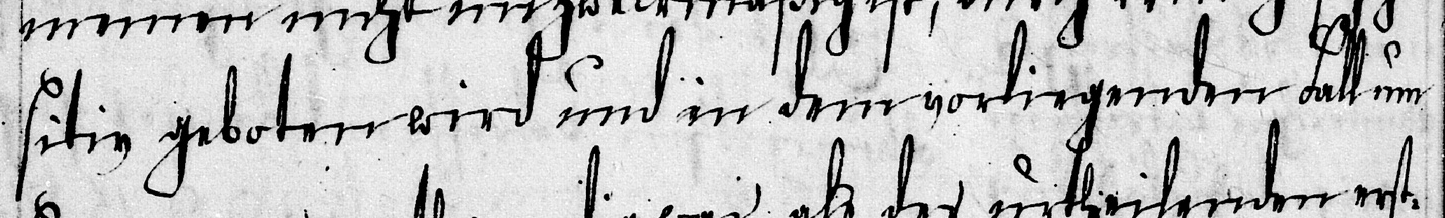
sitiv geboten wird und in dem vorliegenden Fall um
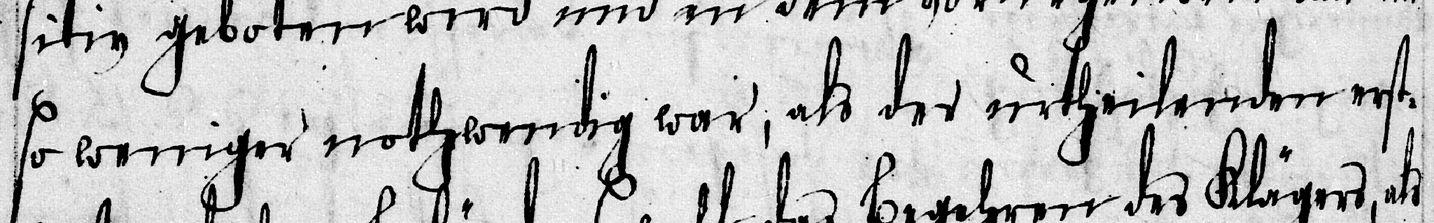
so weniger nothwendig war, als der ertheilenden erst¬
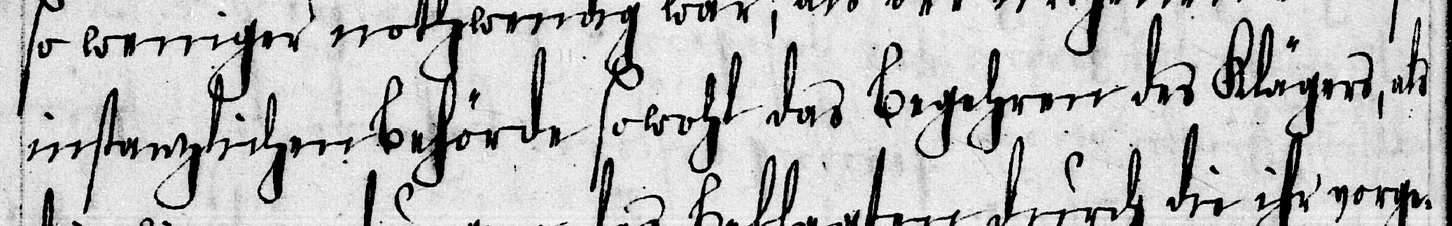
instanzlichen Behörde sowohl das Begehren des Klägers, a¬
